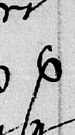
uf¬
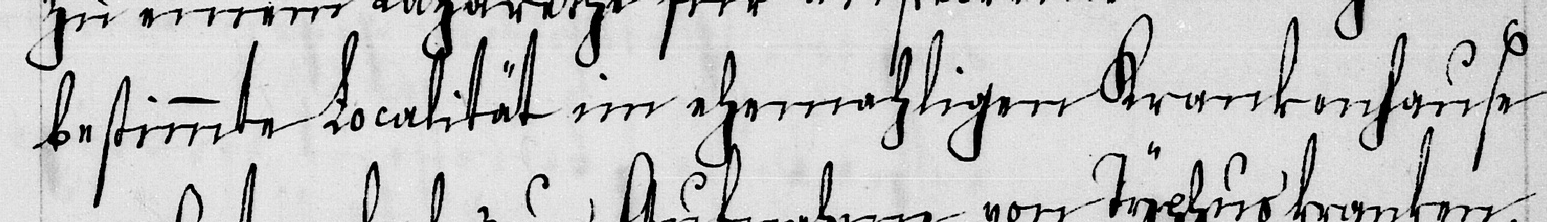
bestimmte Localität im ehemaligen Krankenhause
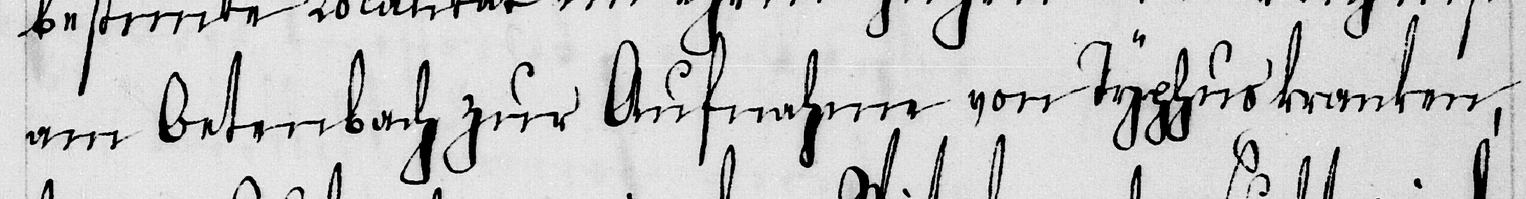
am Oetenbach zur Aufnahme von Typhuskranken,
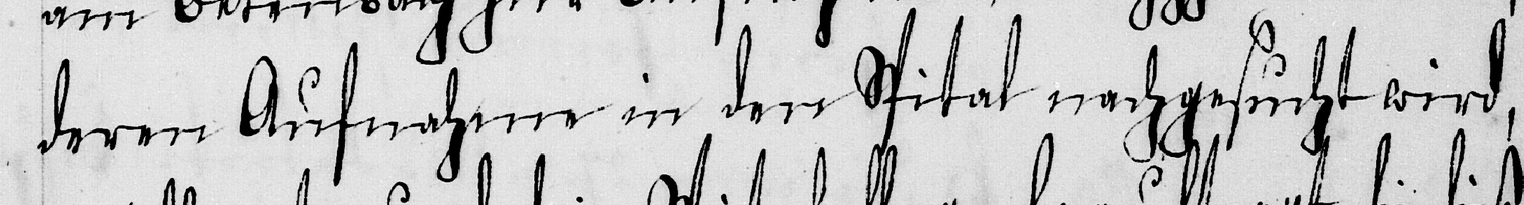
deren Aufnahme in den Spital nachgesucht wird,
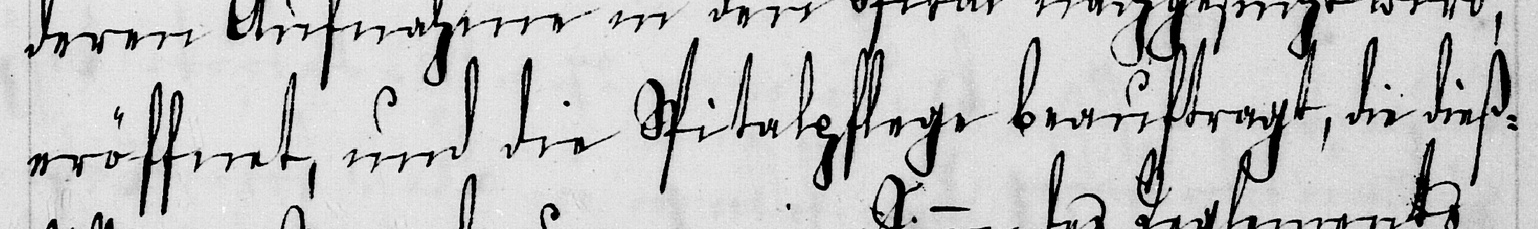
eröffnet, und die Spitalpflege beauftragt, die die¬
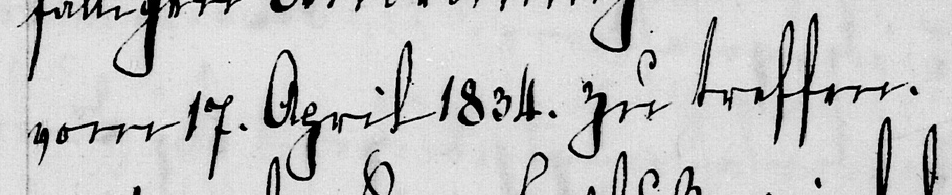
vom 17. April 1834. zu treffen.
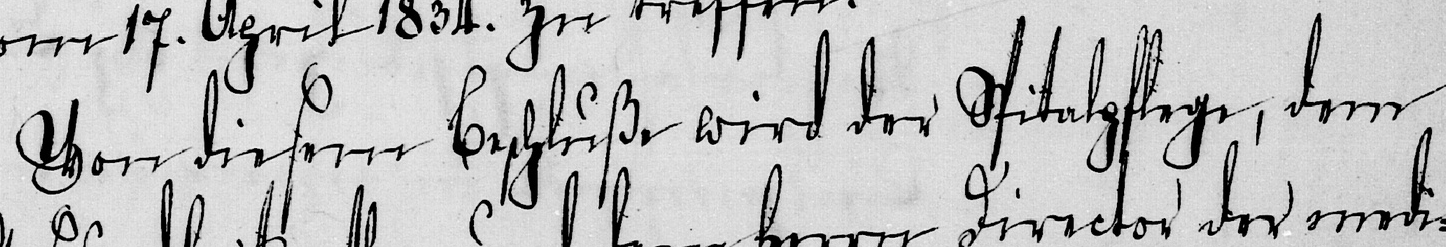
Von diesem Beschluße wird der Spitalpflege, dem
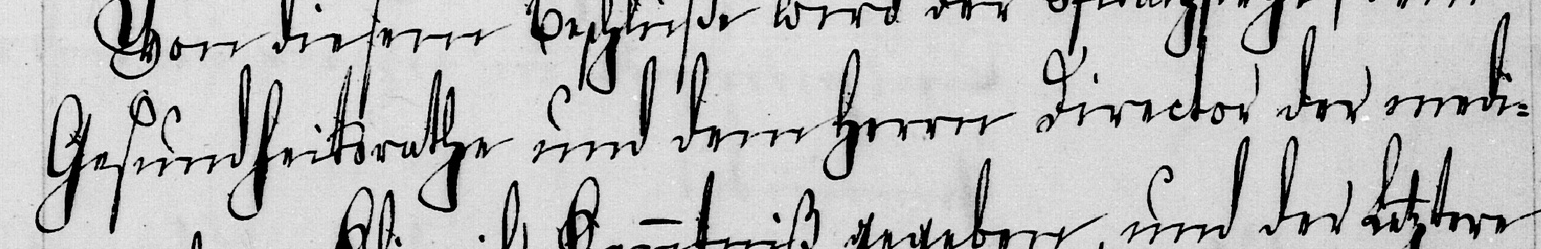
Gesundheitsrathe und dem Herrn Director der medi¬
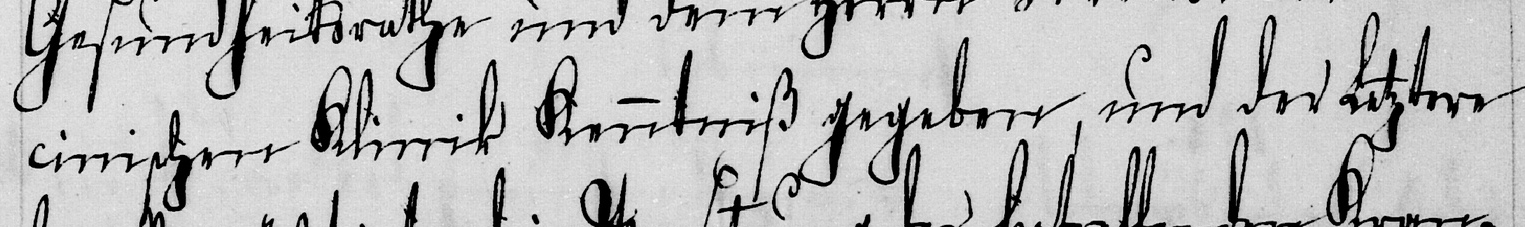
cinischen Klinik Kenntiß gegeben, und der Letztere
